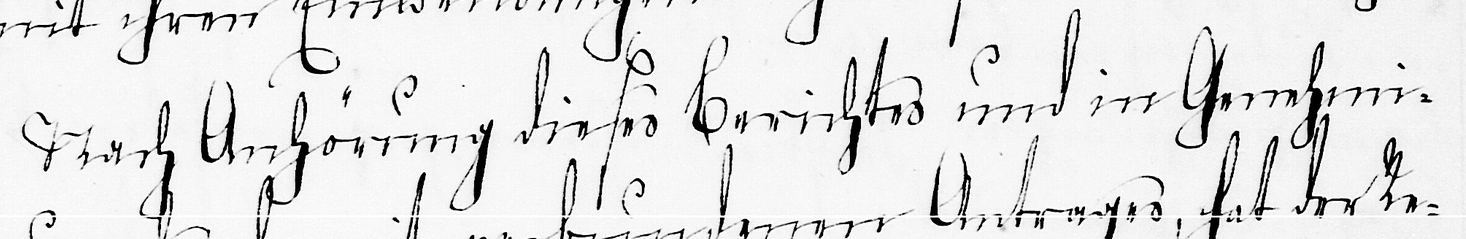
Nach Anhörung dieses Berichtes und in Genehmi¬
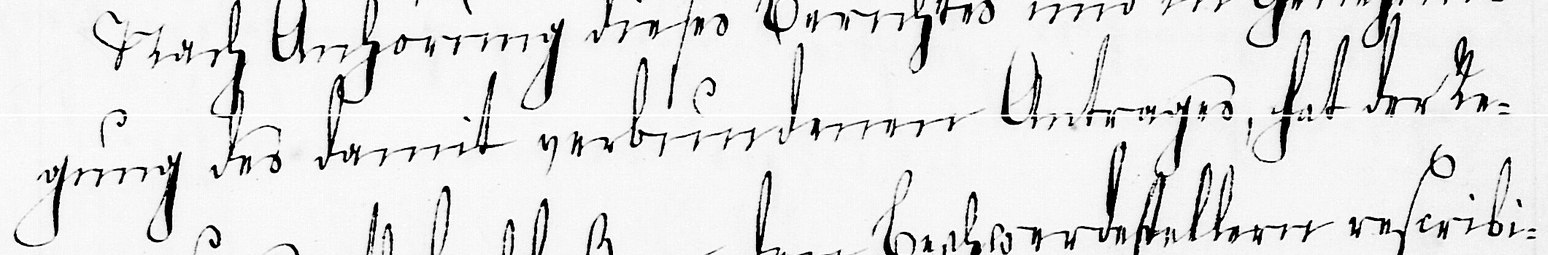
gung des damit verbundenen Antrages, hat der Re¬
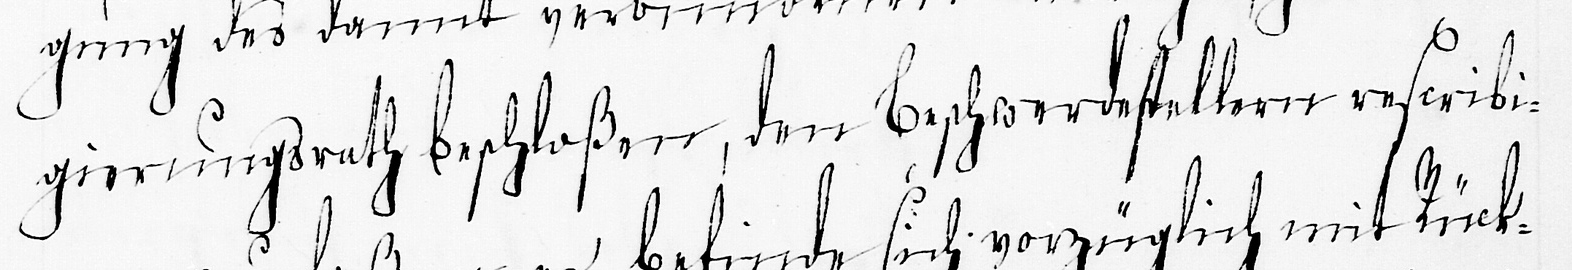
gierungsrath beschloßen, den Beschwerdestellern rescribi¬
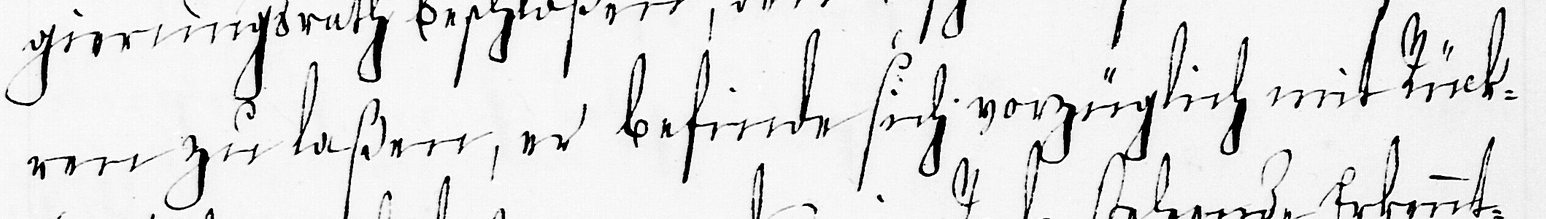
ren zu laßen, er befinde sich vorzüglich mit Rück¬
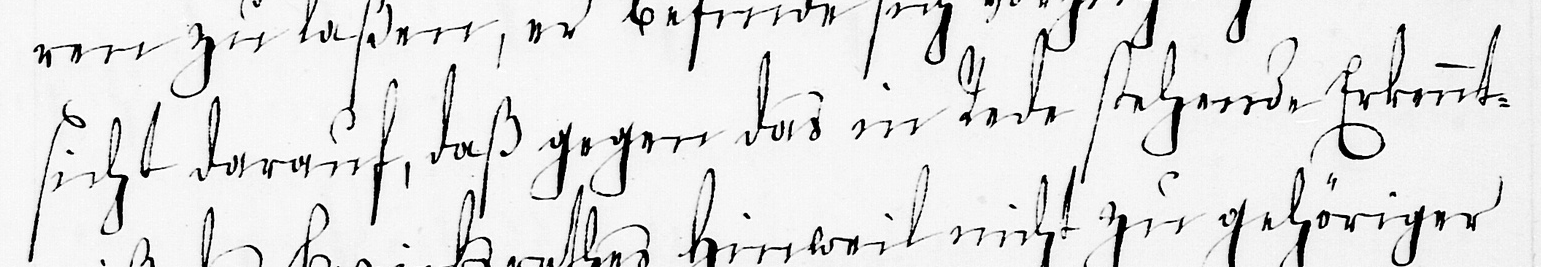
sicht darauf, daß gegen das in Rede stehende Erkennt¬
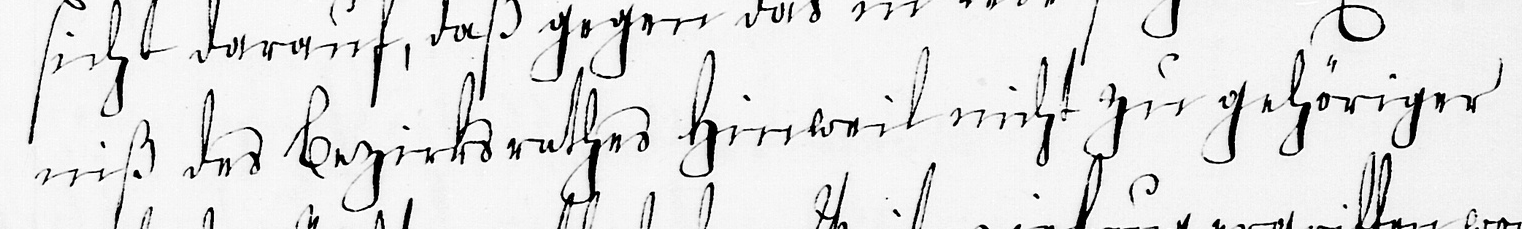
niß des Bezirksrathes Hinweil nicht zu gehöriger
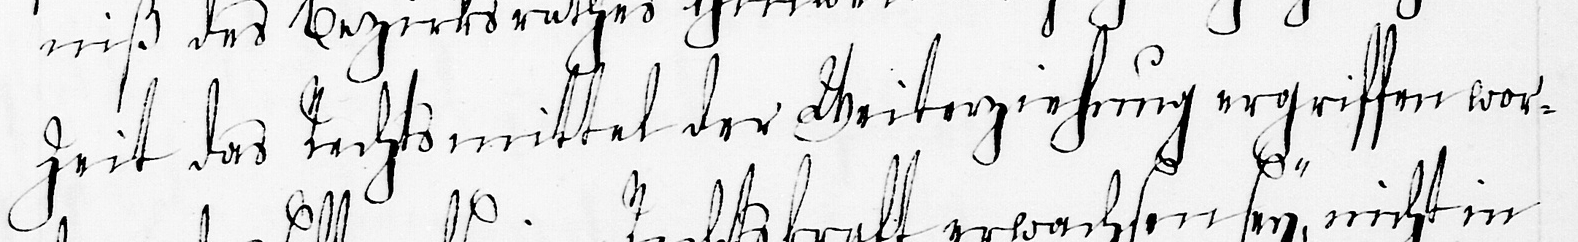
Zeit das Rechtsmittel der Weiterziehung ergriffen wor¬
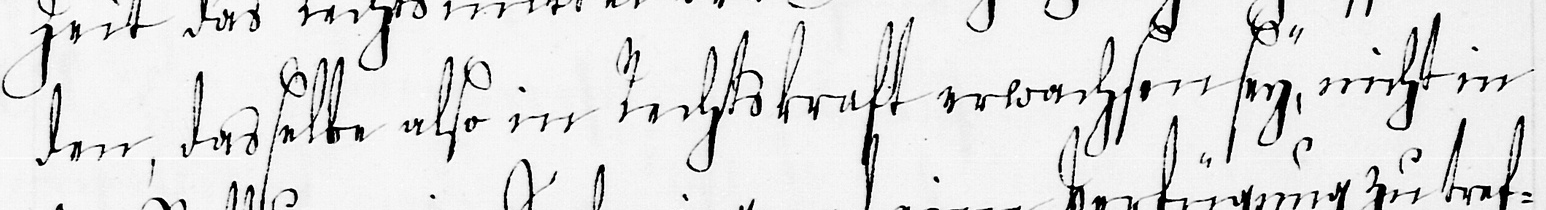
den, dasselbe also in Rechtskraft erwachsen sey, nicht in
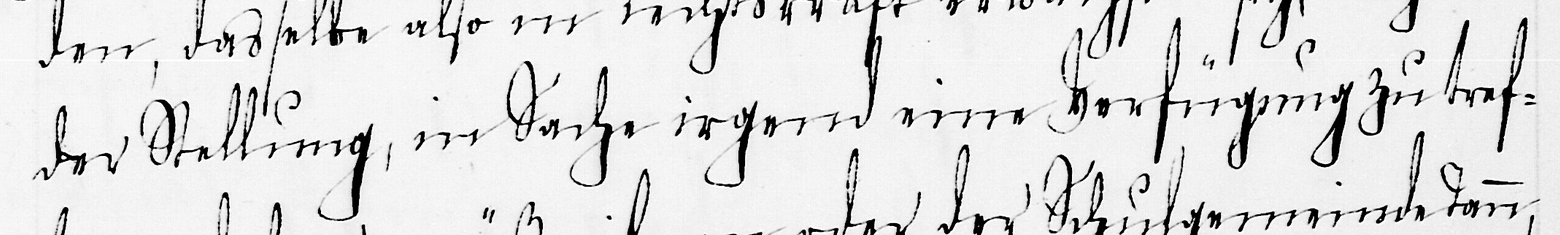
der Stellung, in Sache irgend eine Verfügung zu tref¬
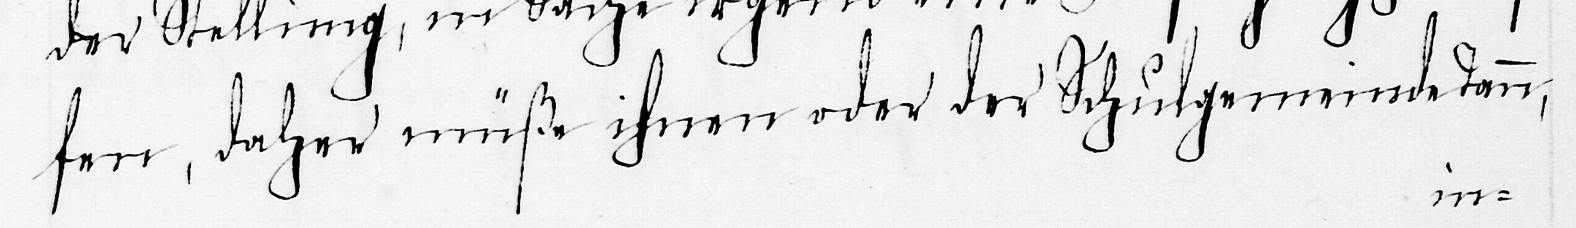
fen, daher müße ihnen oder der Schulgemeinde Tan¬
